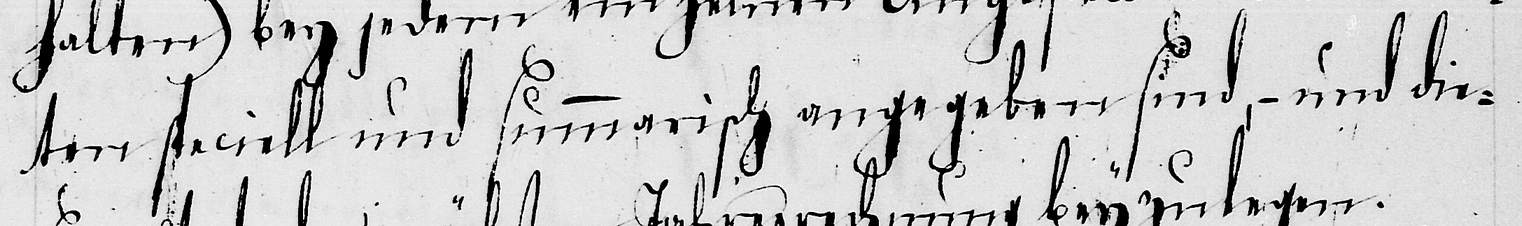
ten speciell und summarisch eingegeben sind, – und die¬
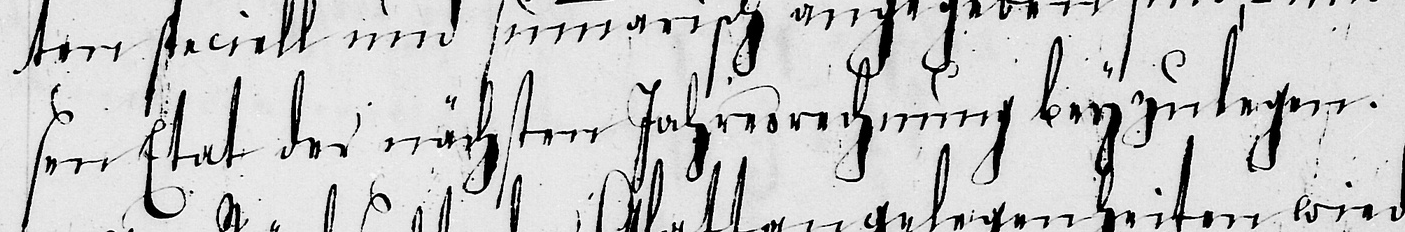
sen Etat der nächsten Jahresrechnung beyzulegen.
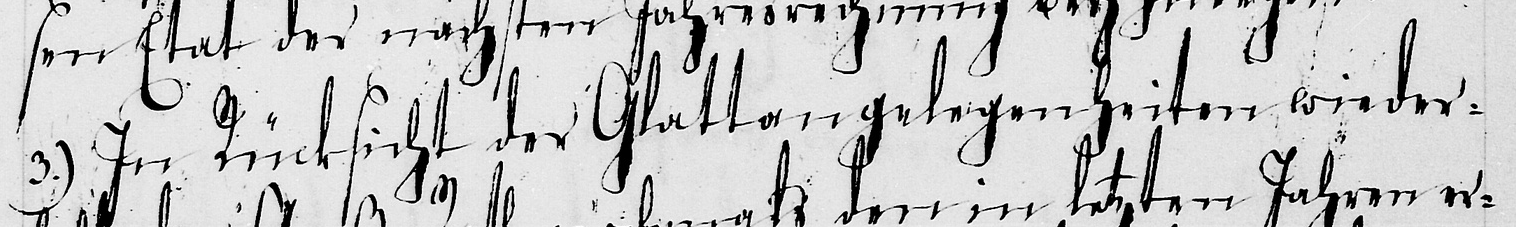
3.) In Rücksicht der Glattangelegenheiten wieder¬
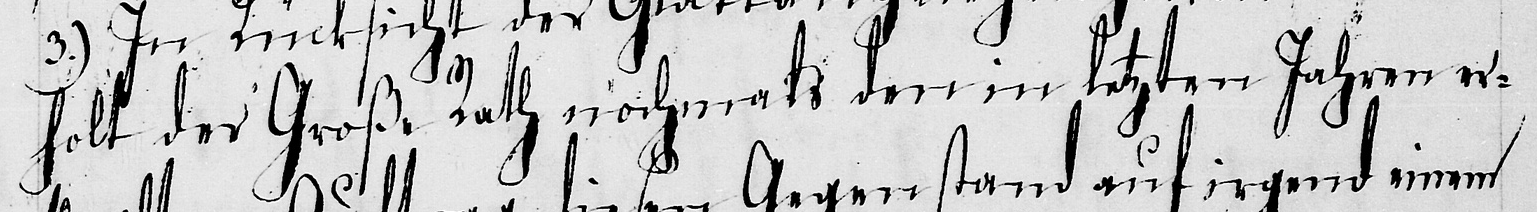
holt der Große Rath nochmals den in letzten Jahren er¬
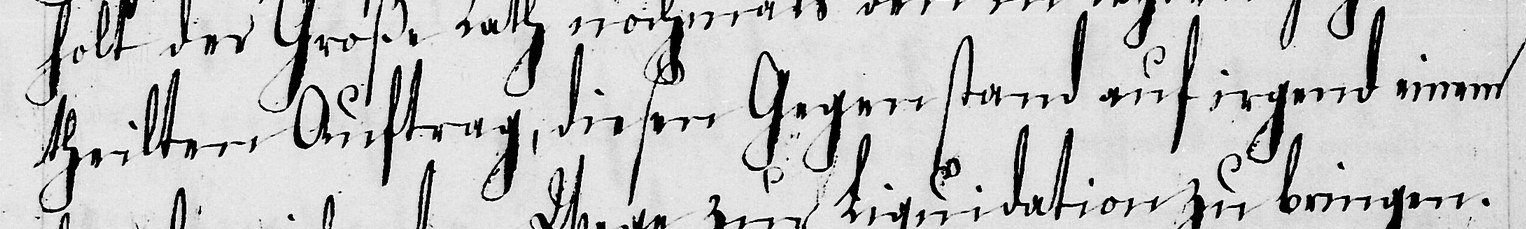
theilten Auftrag, diesen Gegenstand auf irgend einem
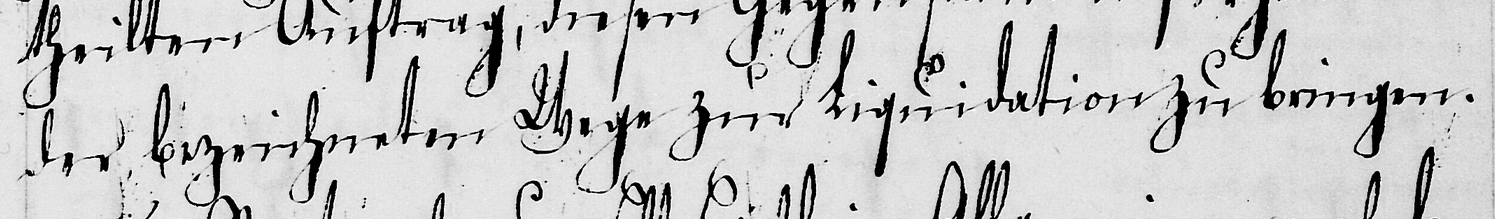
der bezeichneten Wege zur Liquidation zu bringen.
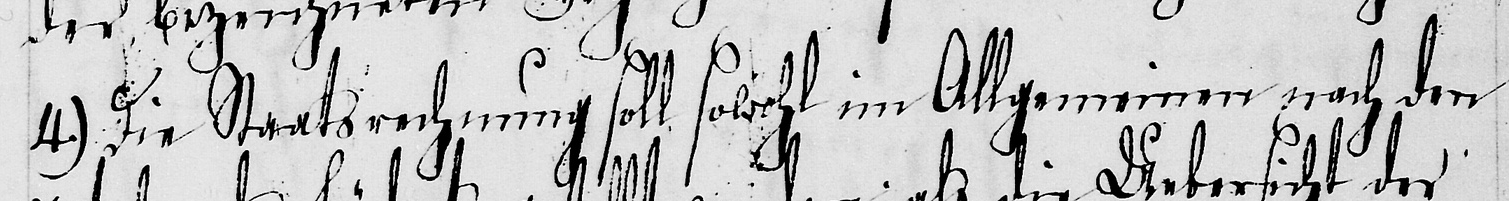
4.) Die Staatsrechnung soll sowohl im Allgemeinen nach den
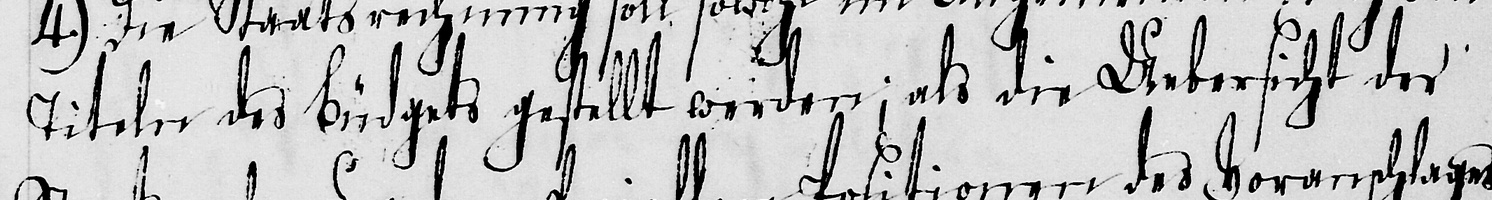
Titeln des Büdgets gestellt werden; als die Uebersicht der
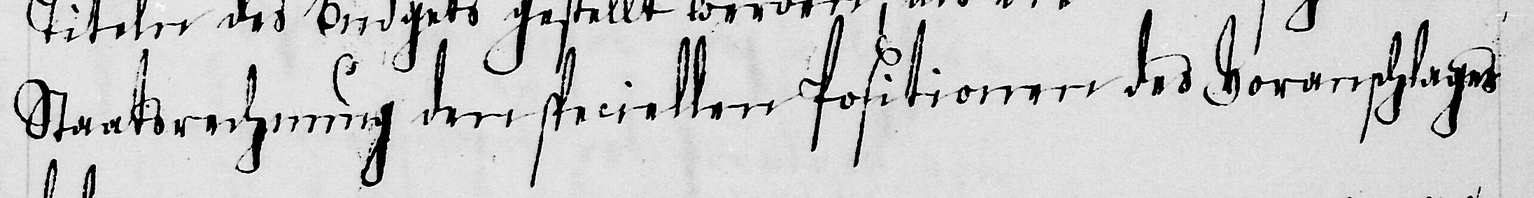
Staatsrechnung den speciellen Positionen des Voranschlages
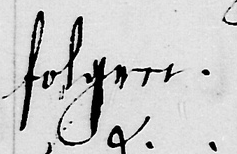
folgen.
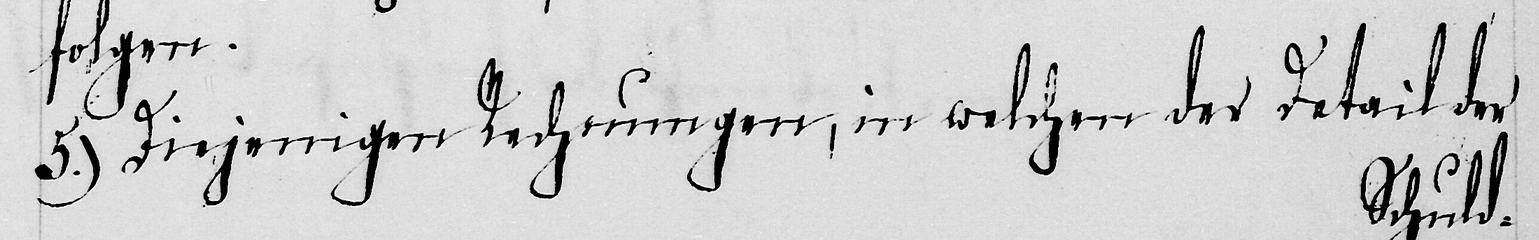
5.) Diejenigen Rechnungen, in welchen der Detail der
